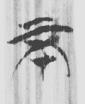不
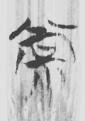常
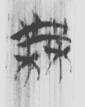無
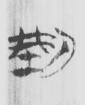型
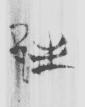邦
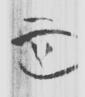正
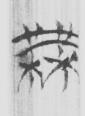無
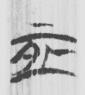亙
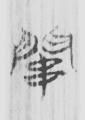{門串}
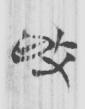敀
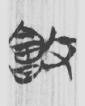{會攴}
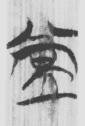當
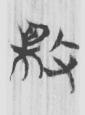{月木攴}
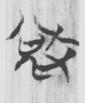敓
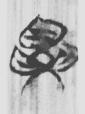要
